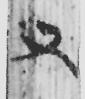又
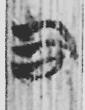司
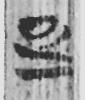疋
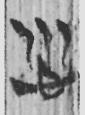{川心}
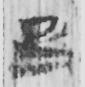疋
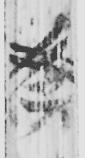𡥈
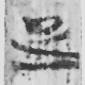疋
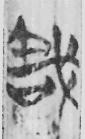{？戈口}
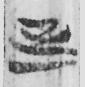疋
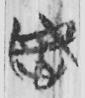悔（謀）
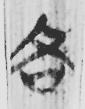各
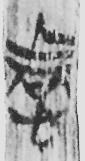𢝬
